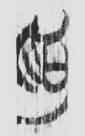爲
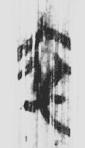衣
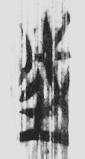城（成）
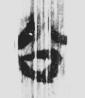公
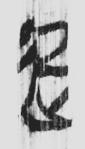○（起）
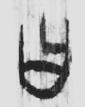曰
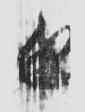臣
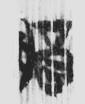𨟻（將）
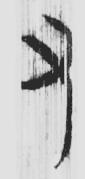又
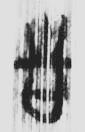告
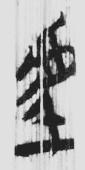○（吾）
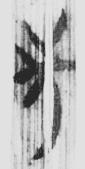先
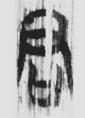君
